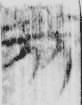㒭
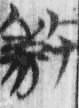殺
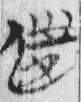○（僕）
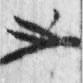之
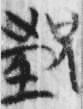○（兄）
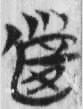○（僕）
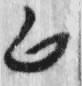㠯（以）
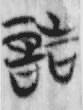誥
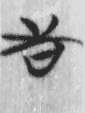告
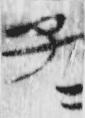子
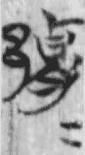宛宛
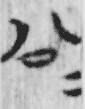公
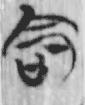命
